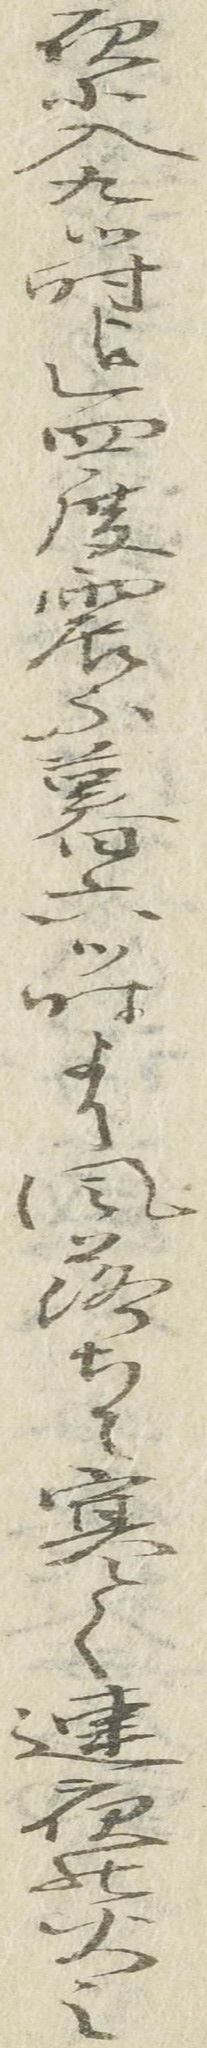夜に入九ツ時迄四度震ふ暮六ツ時より風落ちて寒く連夜の火之
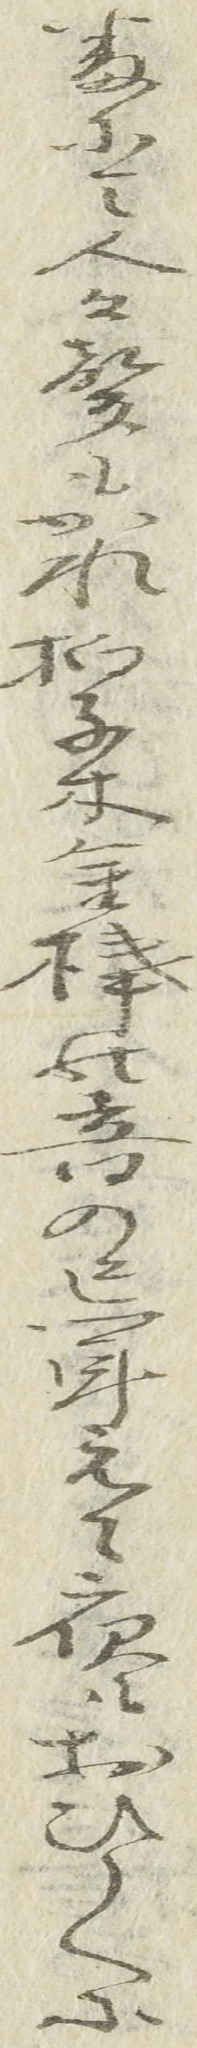番にて人々聲もかれ拍子木金棒の音のみ聞えて夜もおひ〳〵に
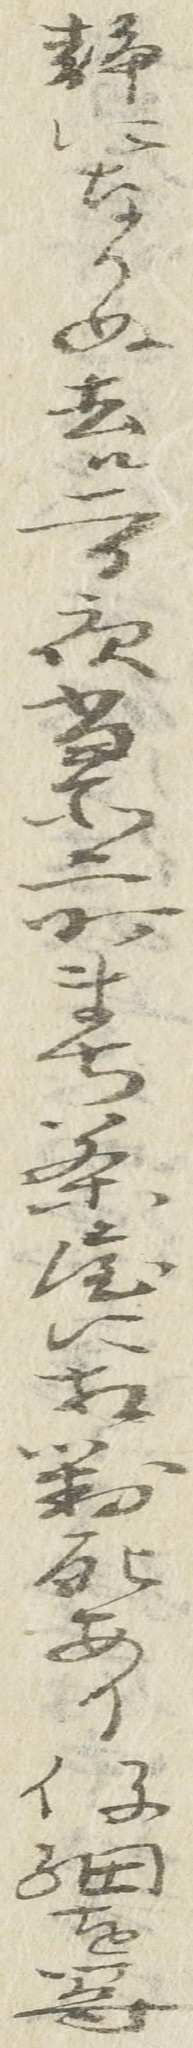静になりぬ去る二日夜当所上町まち茶屋に相対死あり仔細を尋
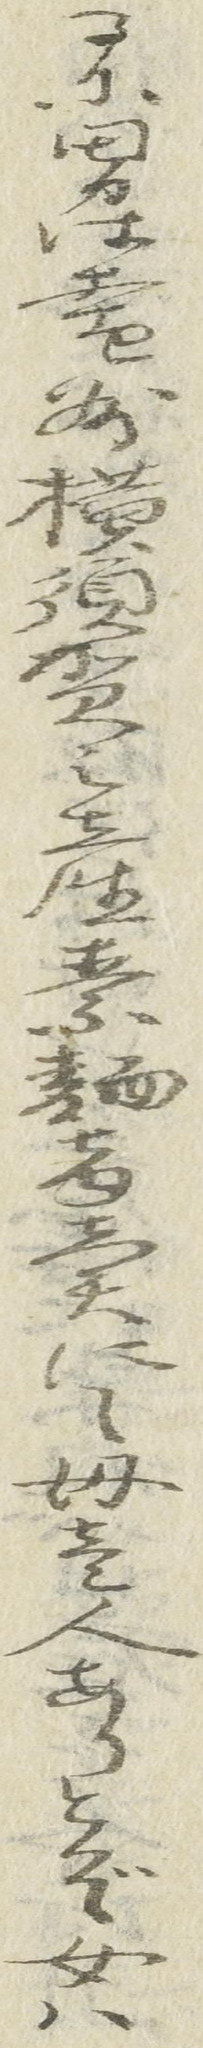るに男は遠州横須賀之産素麺商売にて母壱人ありとぞ女は
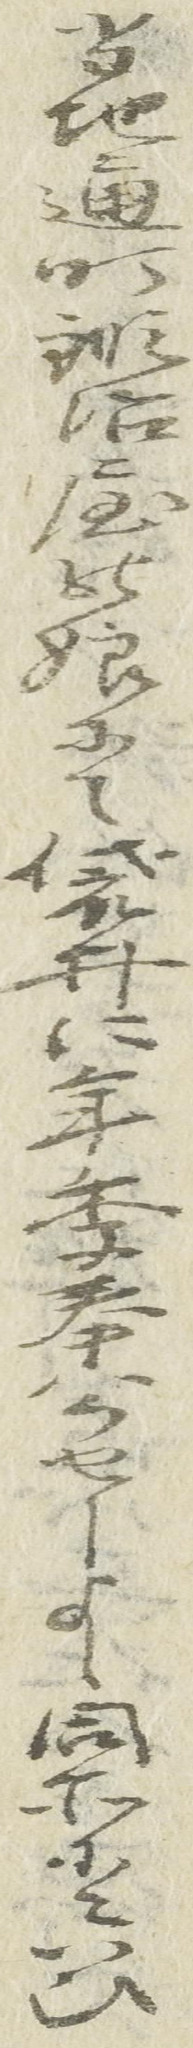当地通町鍛冶屋の娘にて袋井に年季奉公せしよし同所にていひ
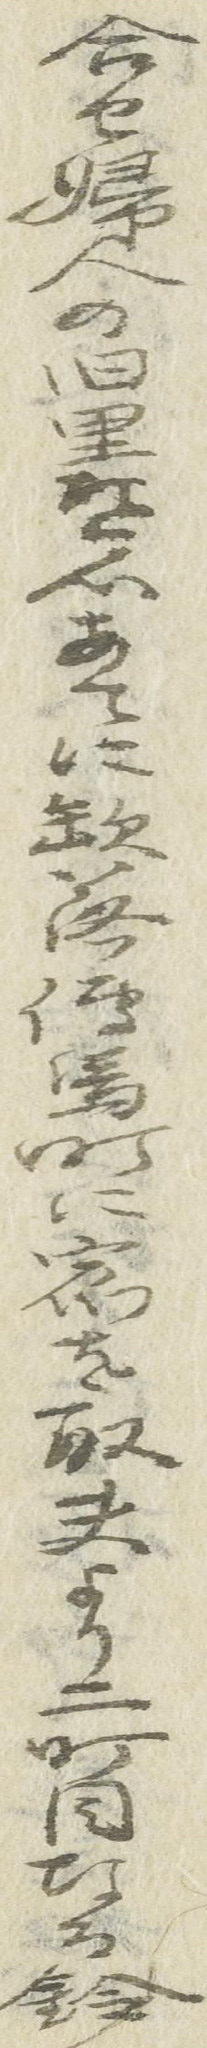合せ婦人の旧里を心あてに缼落伝馬町に宿を取夫より二丁目なる鈴
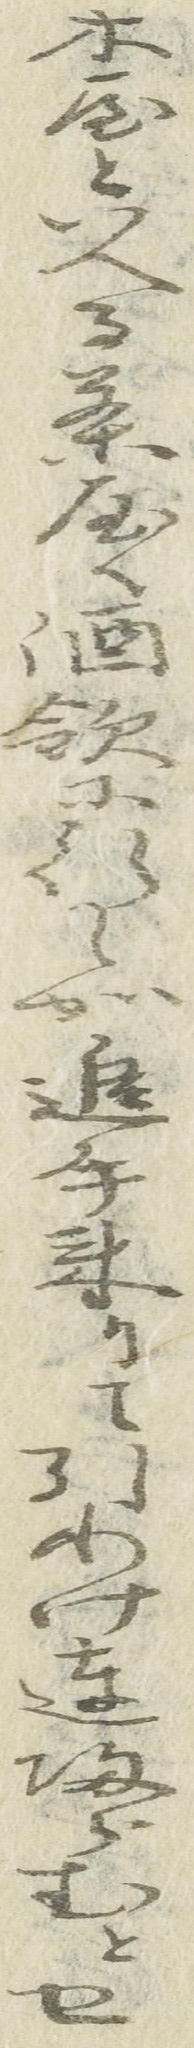木屋といへる茶屋へ酒飲に行しか追手来りて引わけ連帰らむとせ
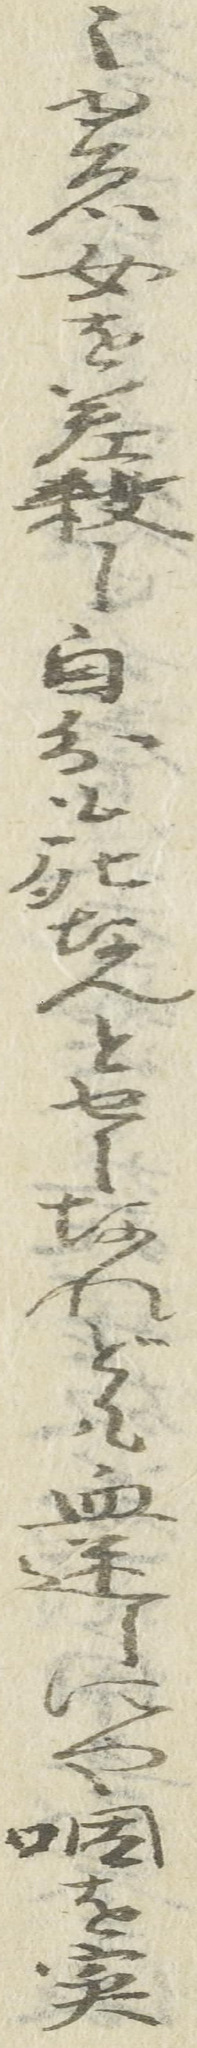しゆゑ女を差殺し自分も死なんとせしなれども血迷しにや咽を突
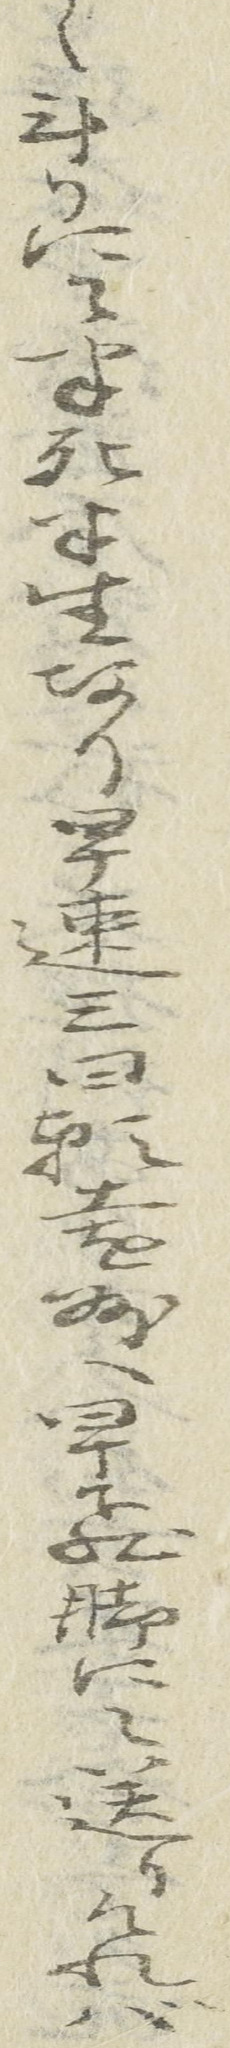し斗りにて半死半生なり早速三日朝遠州へ早飛脚にて送りけれバ
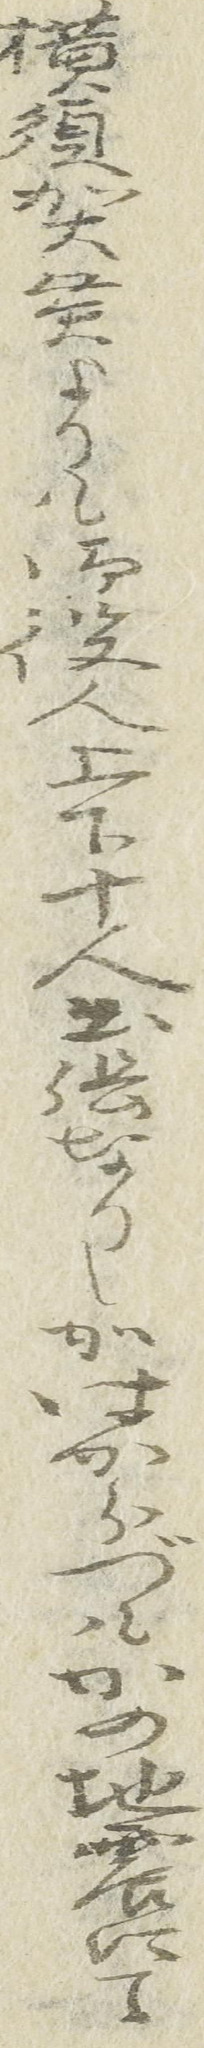横須賀侯よりも御役人上下十人出張なりしかはからづもかの地震にて
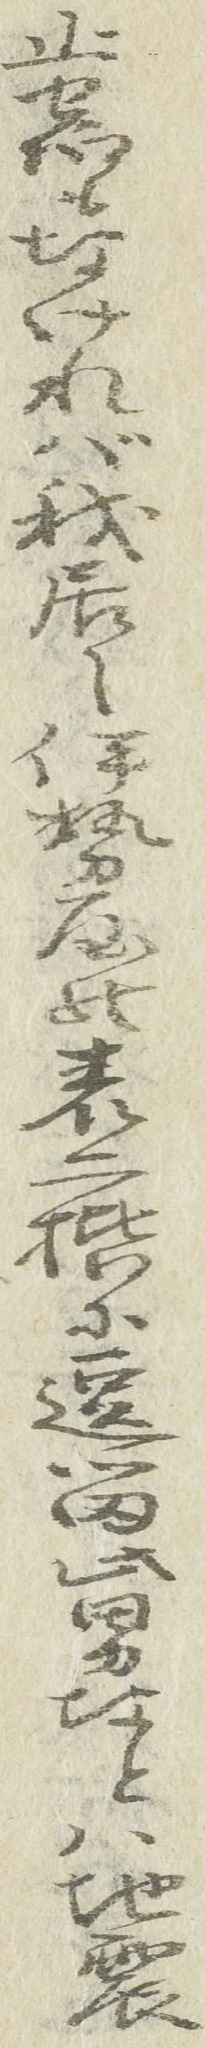止宿もなければ我居し伊勢屋の表二楷に逗留此男なとハ地震
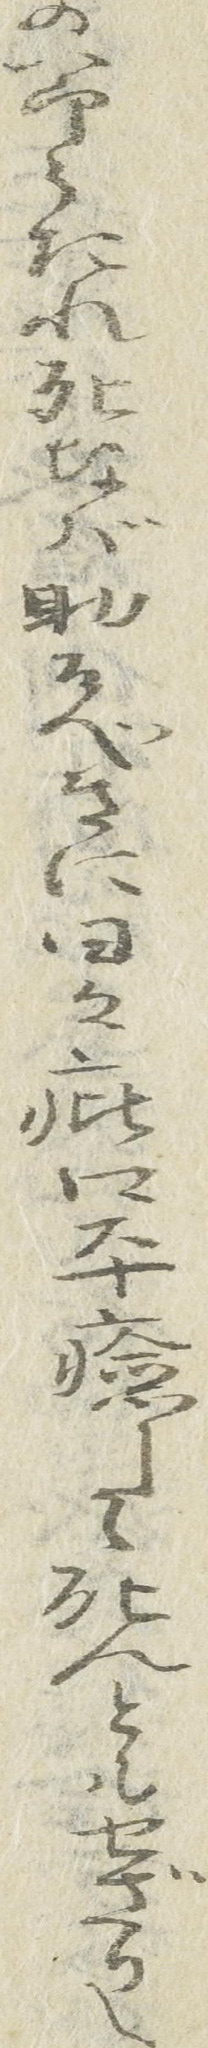の節うたれ死なバ助るべきに日々疵口平癒して死んともせざりし
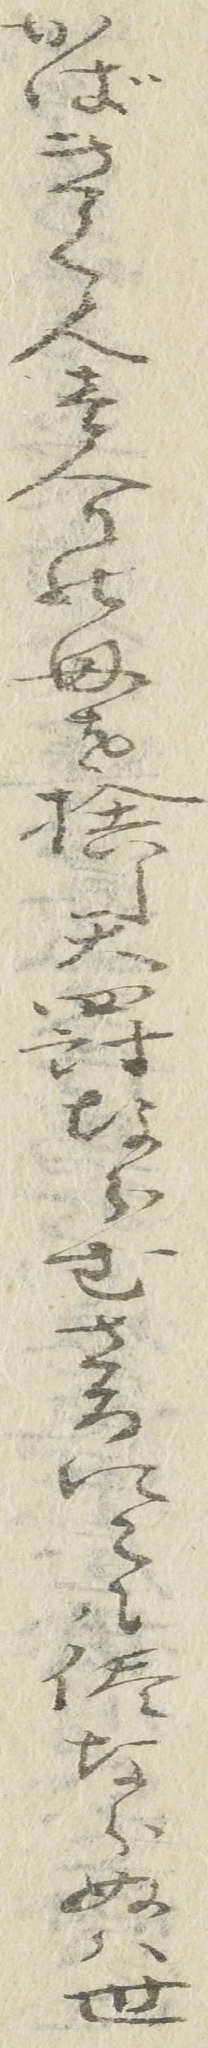かばきく人壱人りの母を捨し天罰ならむさるにても儘ならぬは世
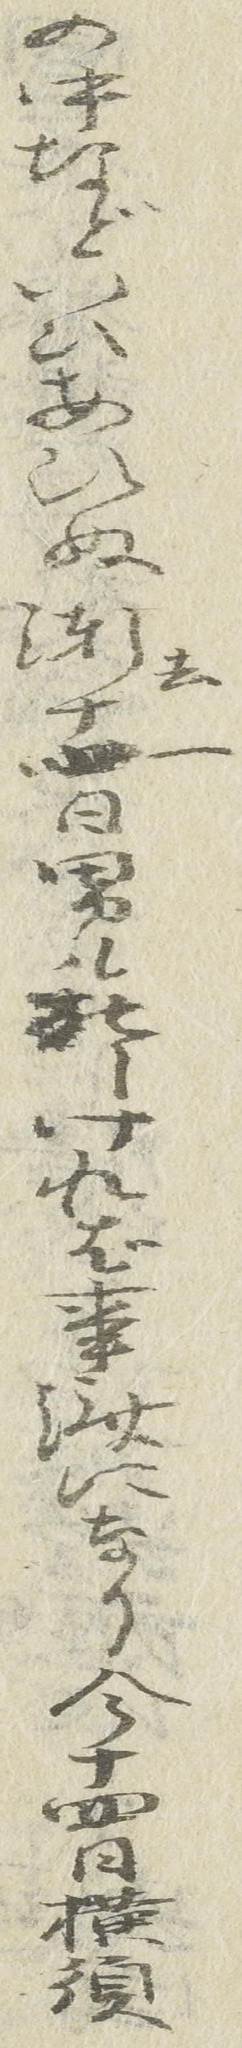の中などいひあひぬ漸十一日男も死しければ事済になり今十四日横須
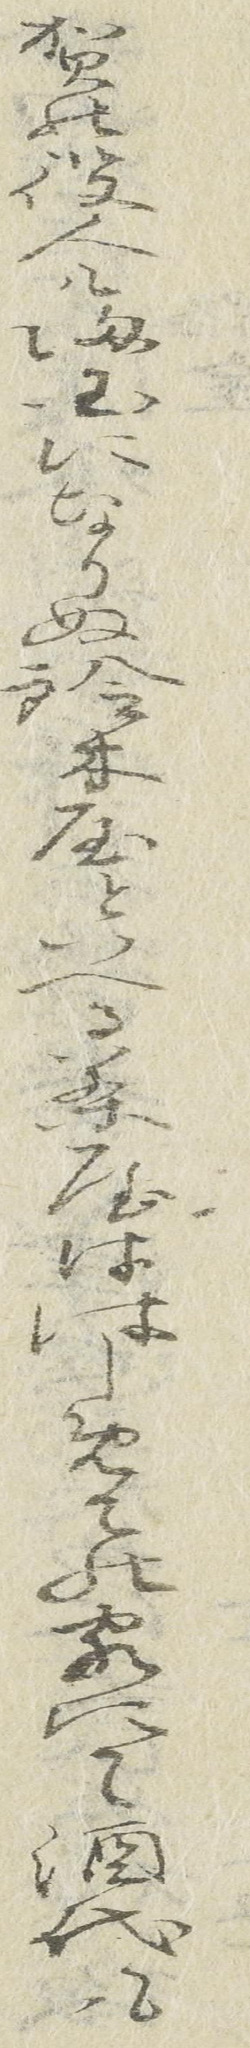賀の役人も帰国になりぬ鈴木屋といへる茶屋ははしめての家にて酒代も
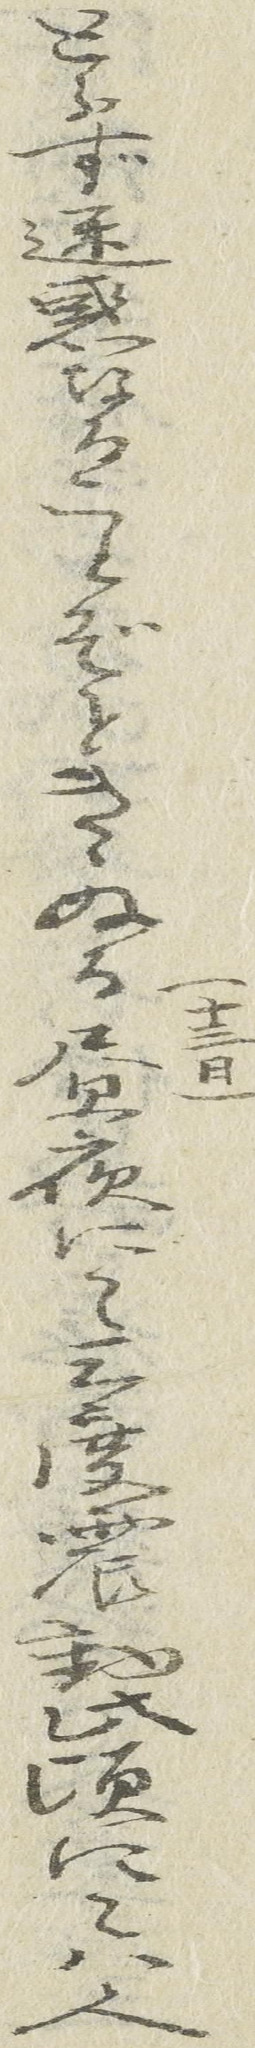とらず迷惑なることぞときゝぬる昼夜にて三度震動此頃にては人
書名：地震前兆集　全
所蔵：東京大学地震研究所図書室 Earthquake Research Institute Library, The University of Tokyo, JAPAN
